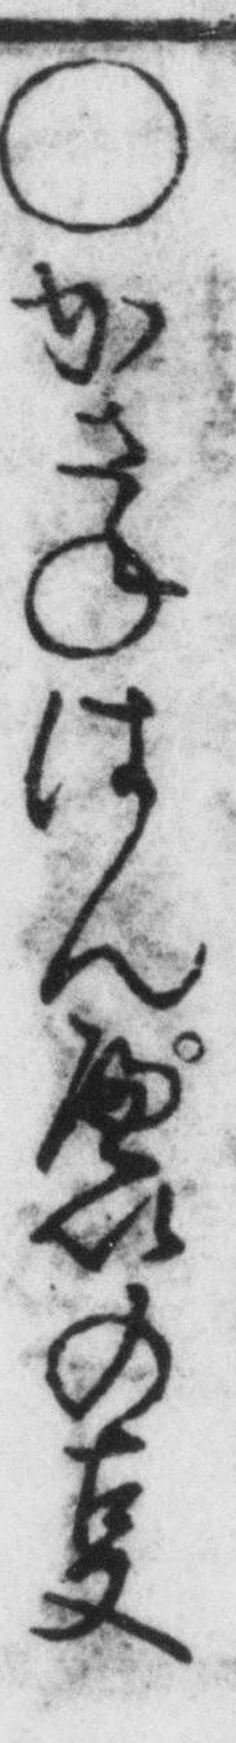〇かさねはんぺいの事
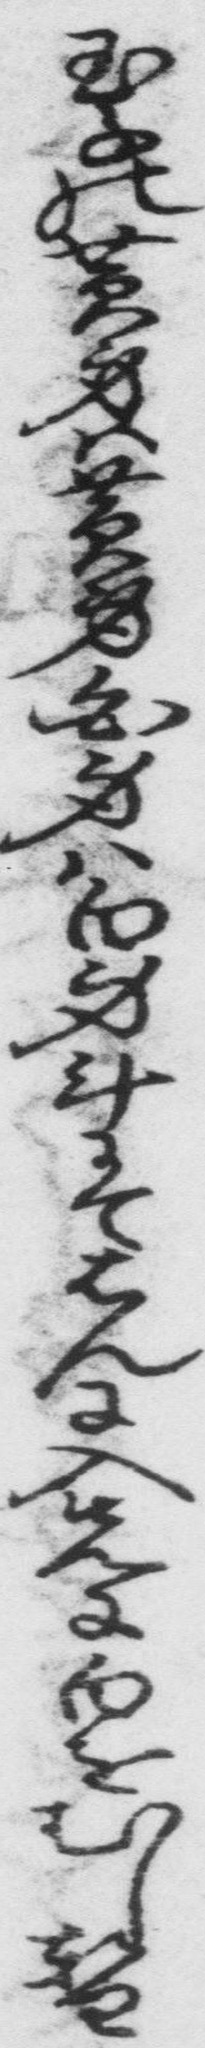玉子の黄身は黄身白身は白身斗にてはんに入先に白をむし暫
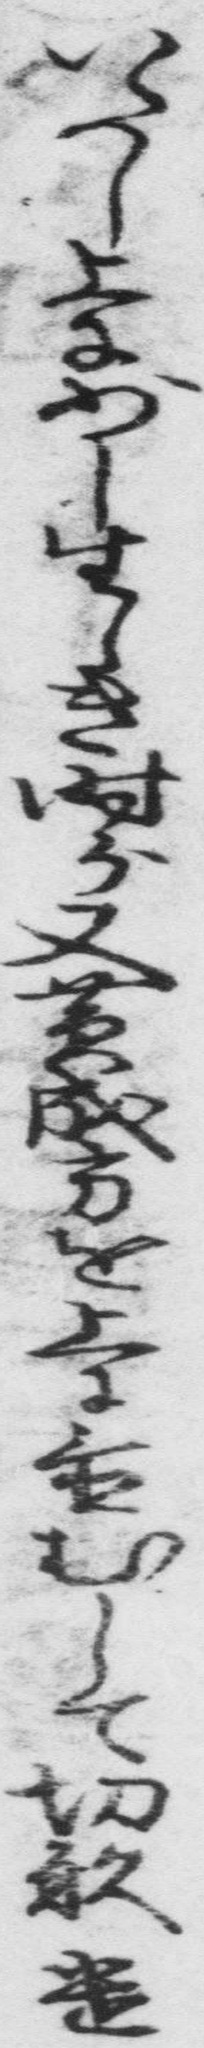いたし上に少し生しき時分又黄成方を上に置むして切敢遣
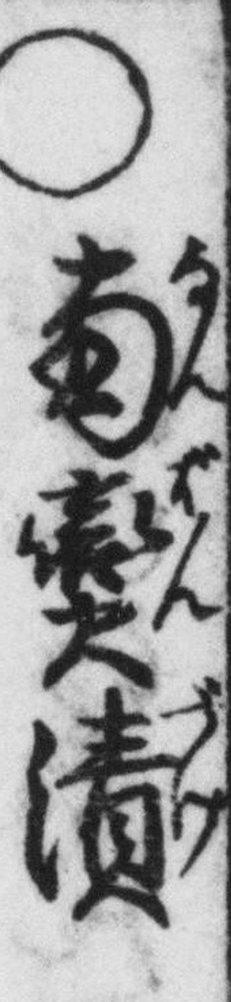〇南蛮漬
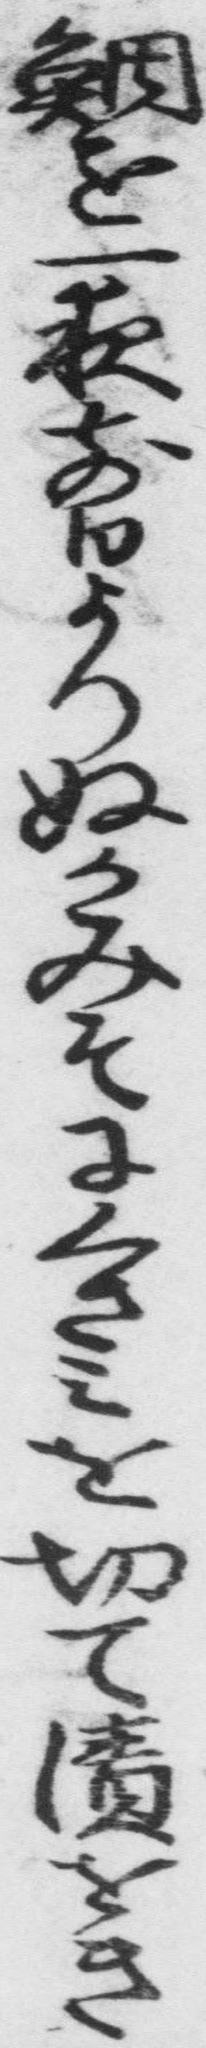鯛を一夜前日よりぬかみそにくさみを切て漬をき
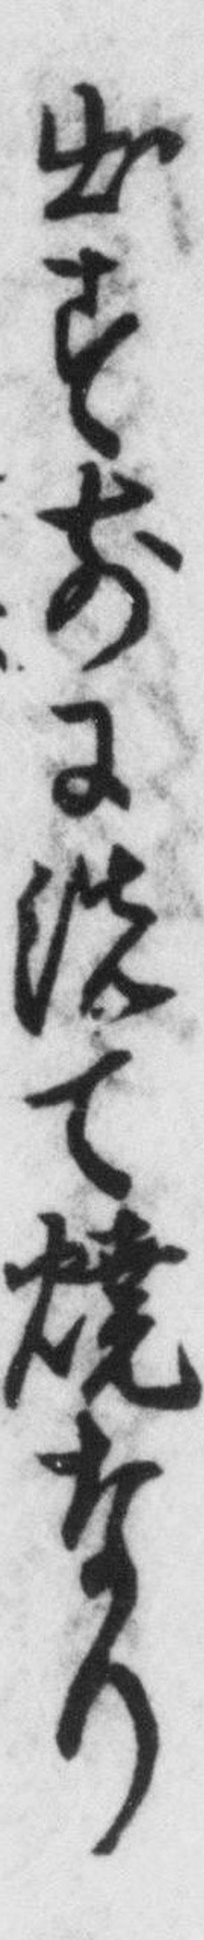出す前に洗て焼なり
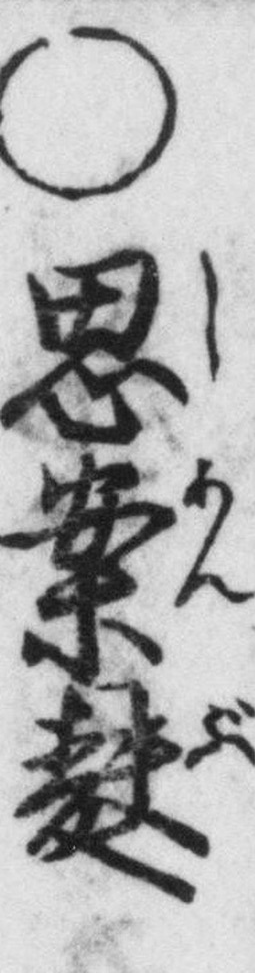〇思案麩
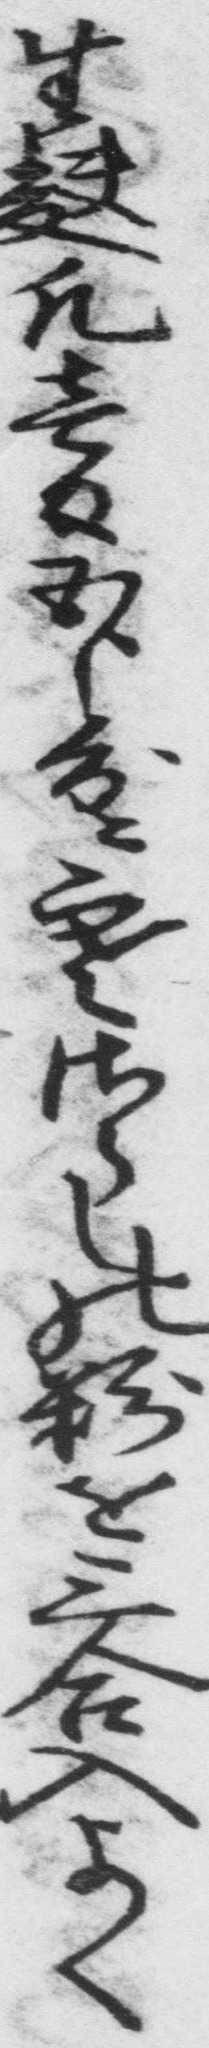生麩凡一匁五分分に寒さらしの粉を三合入よく
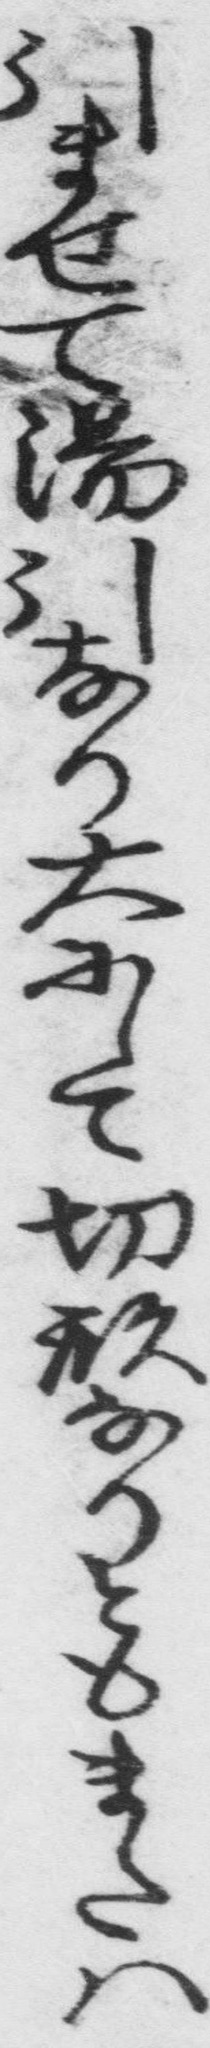引ませて湯引なり大にして切形なりともまたは
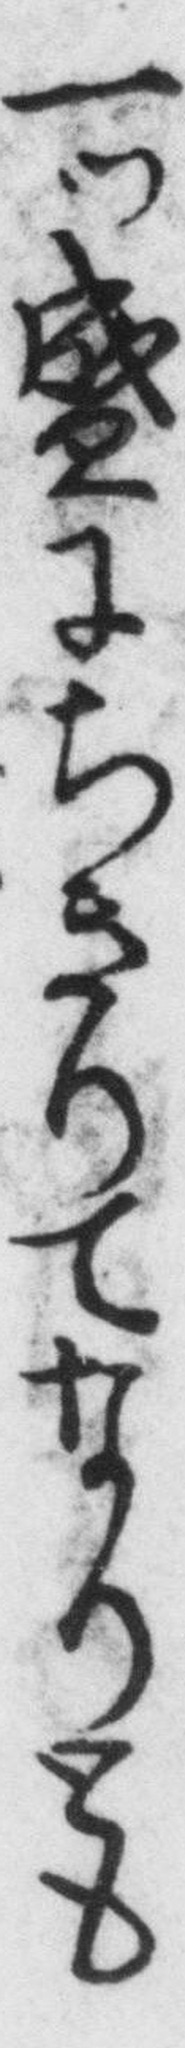一ツ盛にちきりてなりとも
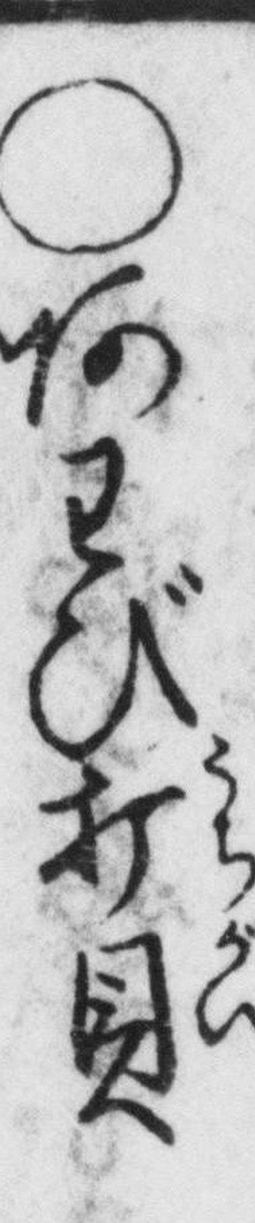〇あわび打貝
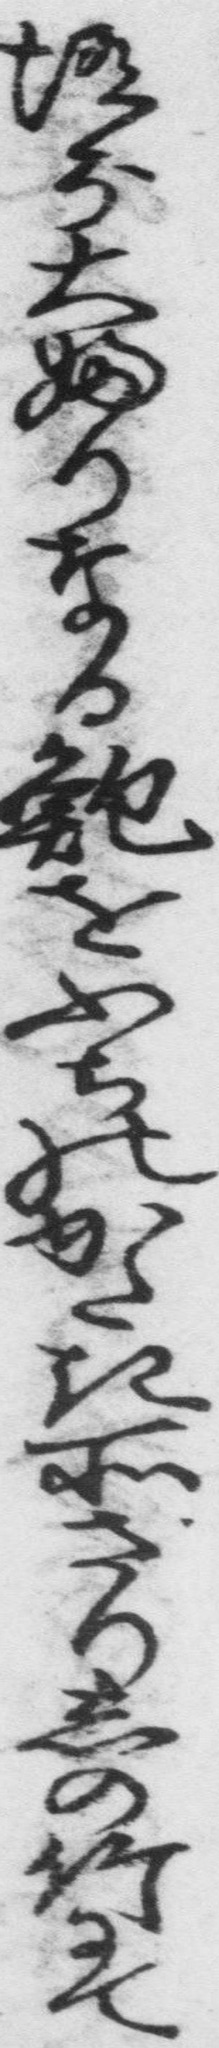随分大ふりなる鮑をふちのかたき所さりしの竹にて

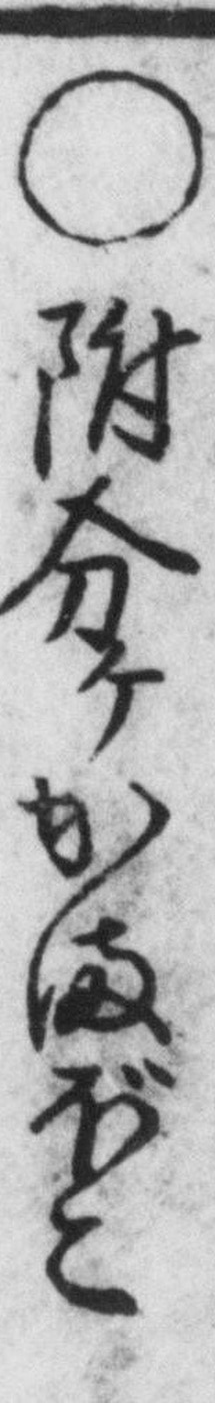〇附分けかまぼこ
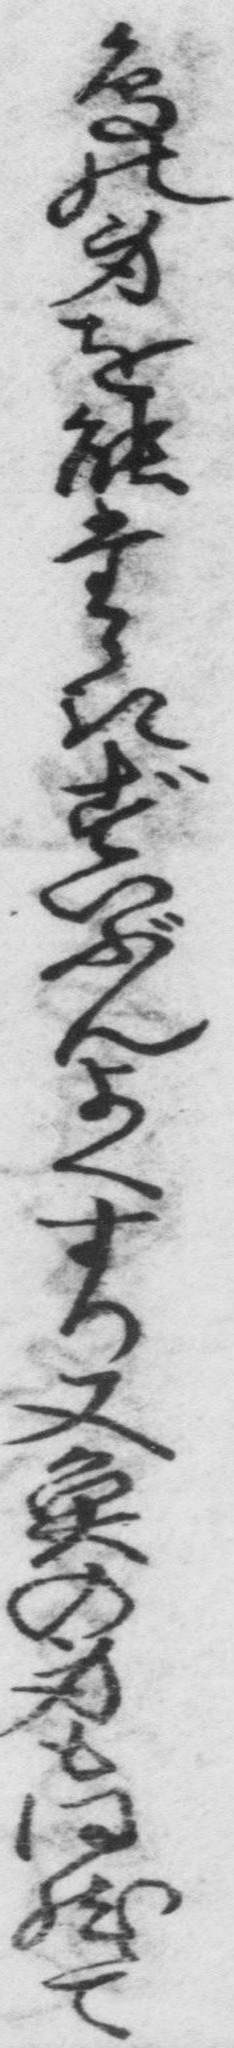鳥の身を能たゝきずいぶんよくすり魚の身も同然て
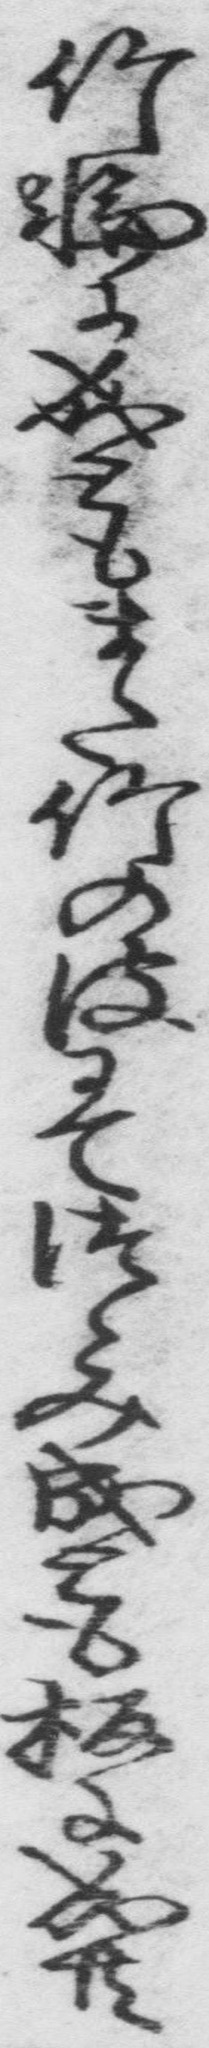竹輪に成ともまた竹の皮にてつゝみ成とも板に成共
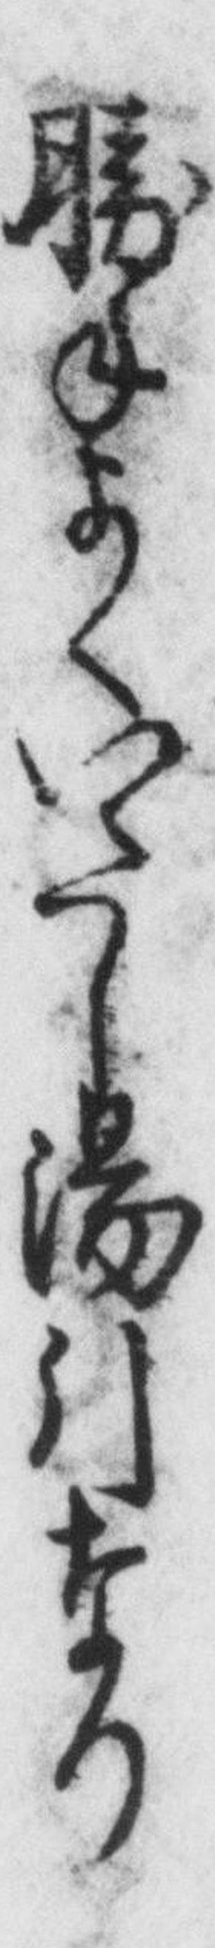勝手よくいたし湯引なり
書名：卓子料理仕様
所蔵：大阪府立大学学術情報センター 国文学研究資料館
